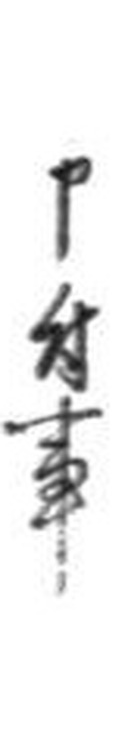申付事
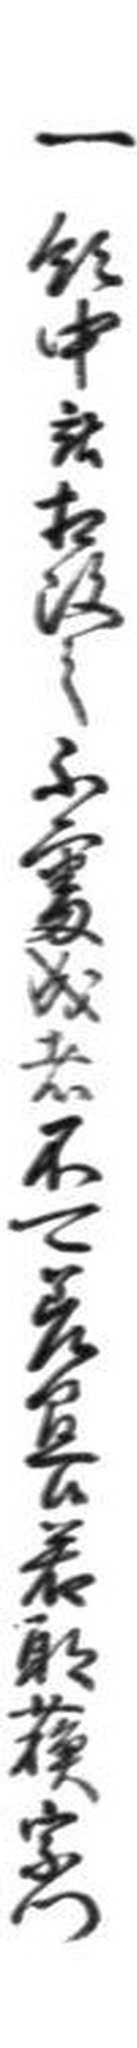一領中被相改之不審成者不可差置候若耶蘇宗門
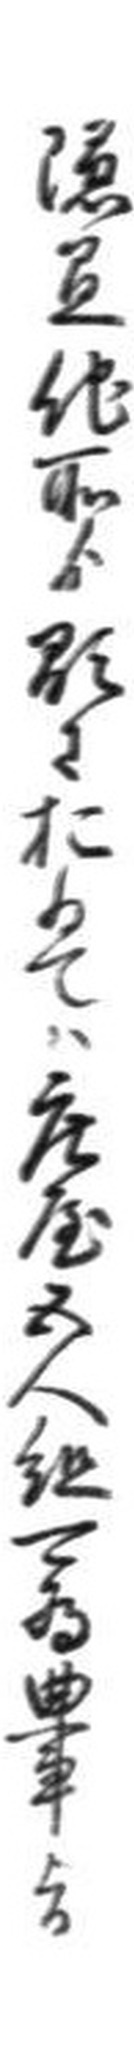隠置他所ゟ顕におゐては庄屋五人組可為曲事旨
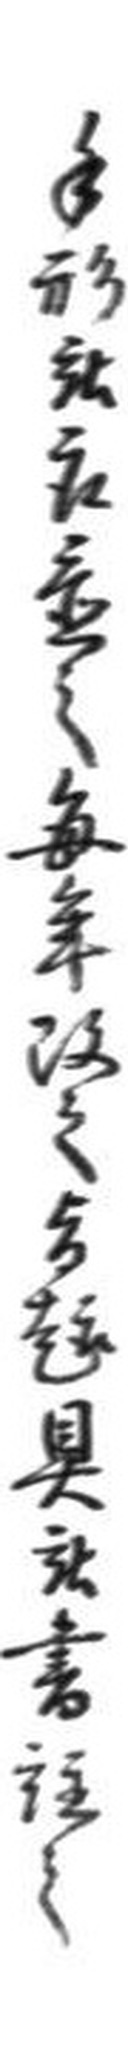手形被取置之毎年改之旨趣具被書註之

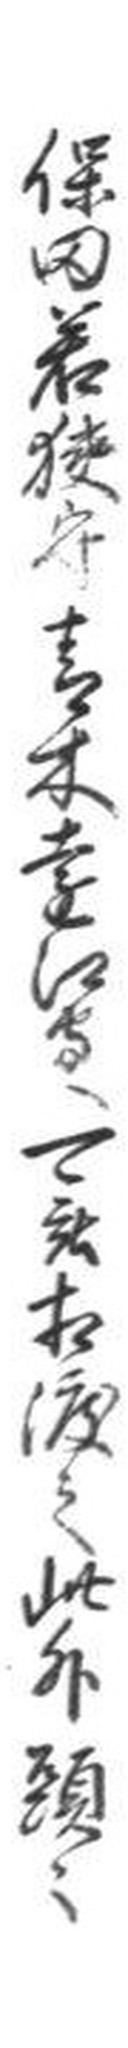保田若狭守青木遠江守へ可被相渡之此外頭々
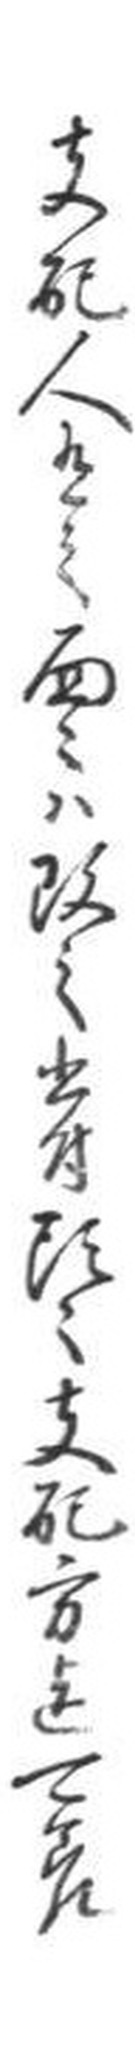支配人有之面々は改之書付頭々支配方迄可差
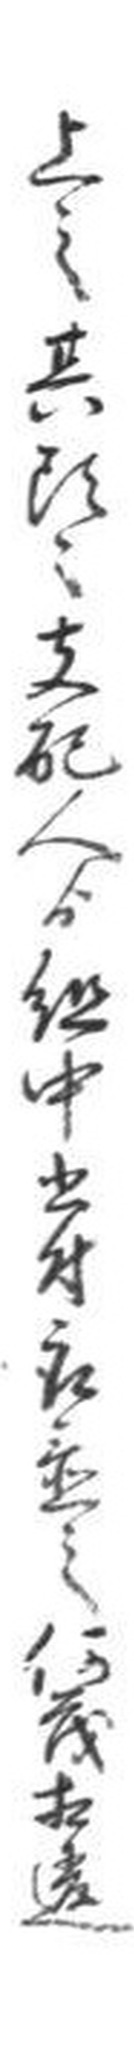上之其頭々支配人ゟ組中書付取置之何も相違
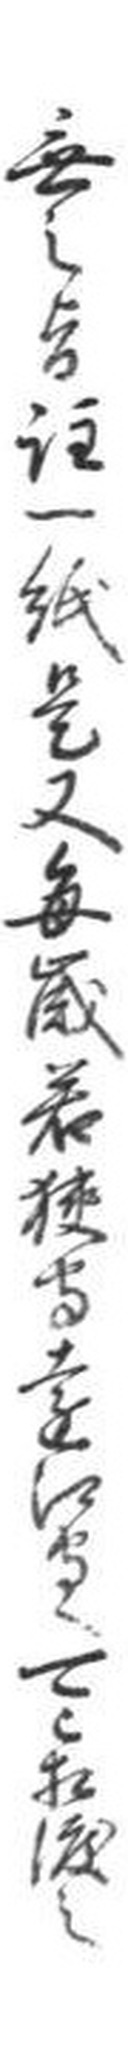無之旨註一紙是又毎歳若狭守遠江守へ可被相渡之
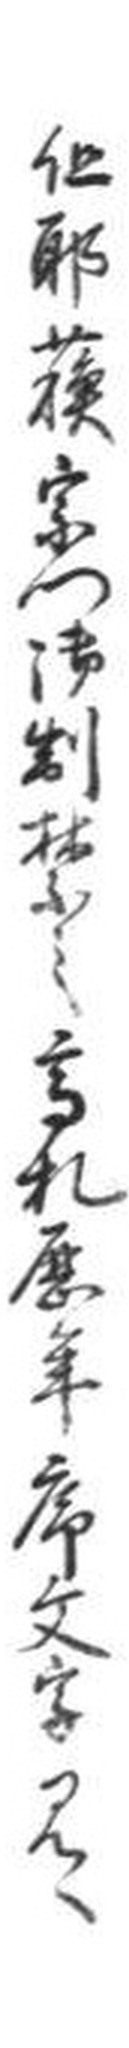但耶蘇宗門御制禁之高札歴年序文字見へ
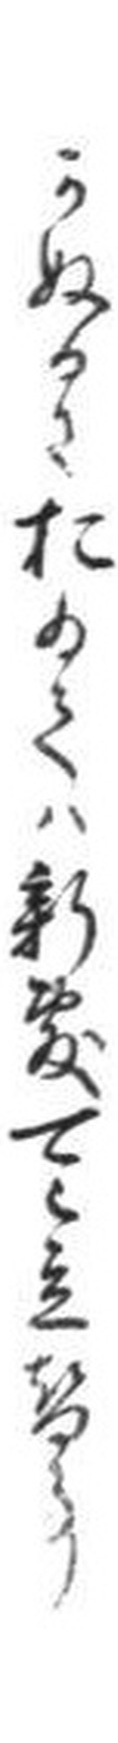かぬるにおゐては新敷可被立替事
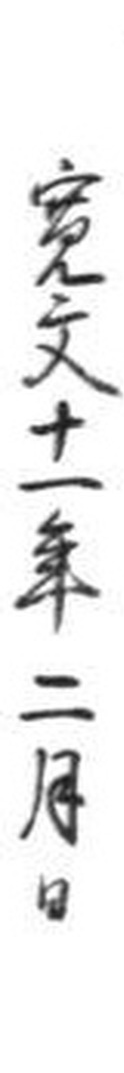寛文十一年二月日
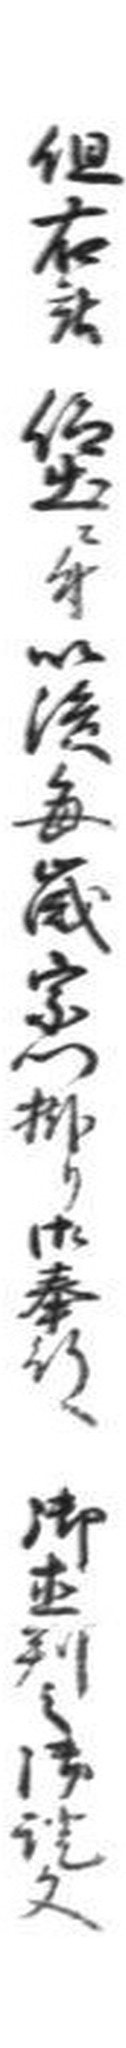但右被仰出ニ付以後毎歳宗門掛り御奉行へ御直判之御證文
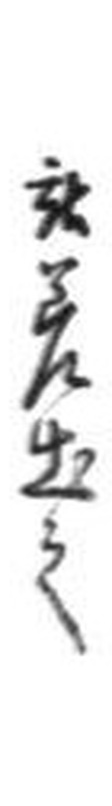被差出之
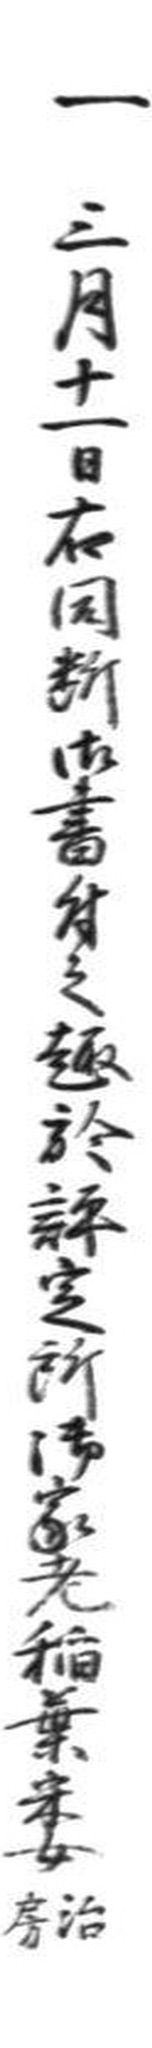一三月十一日右同断御書付之趣於評定所御家老稲葉采女治房
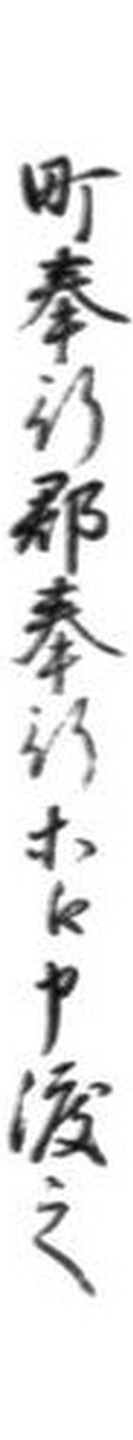町奉行郡奉行等江申渡之
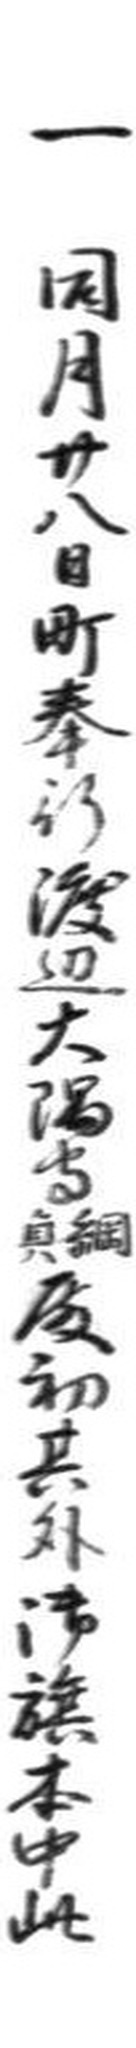一同月廿八日町奉行渡辺大隅守綱貞殿初其外御旗本中此
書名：家譜 八 光通公 従寛文十年到同十二年
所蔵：福井県文書館 Fukui Prefectural Archives
